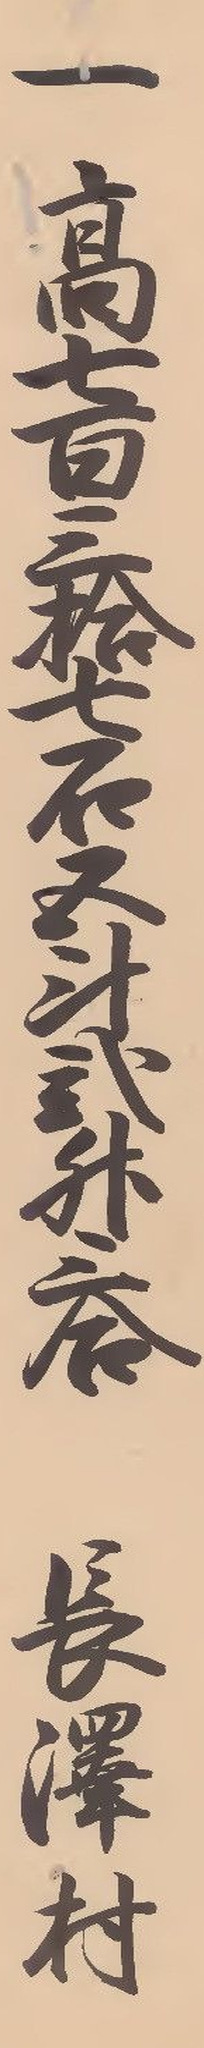一高七百三拾七石五斗弐升三合長沢村
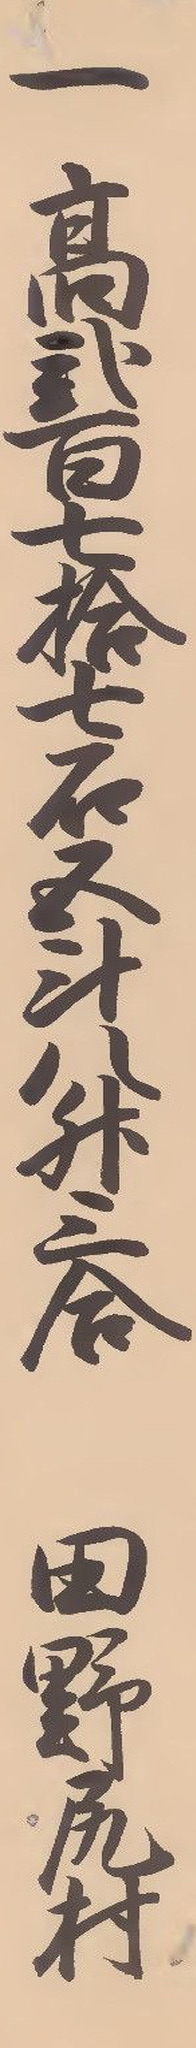一高弐百七拾七石五斗八升三合田野尻村

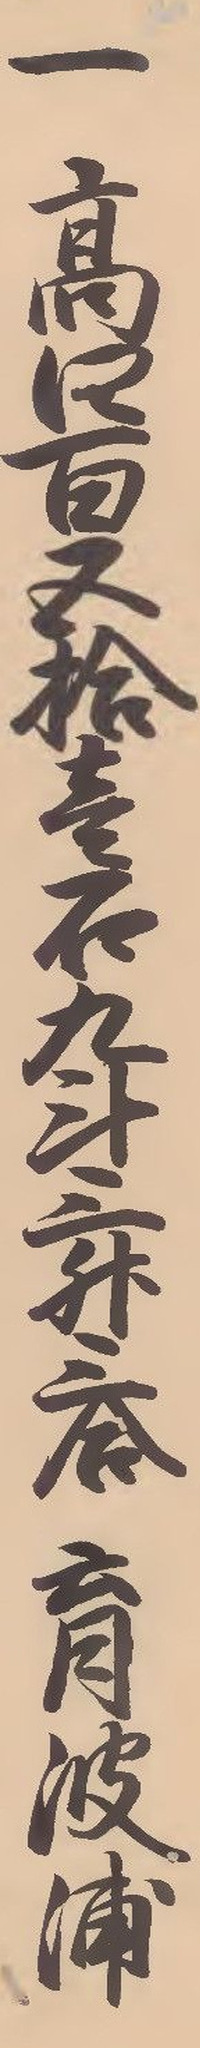一高四百五拾壱石九斗三升三合育波浦
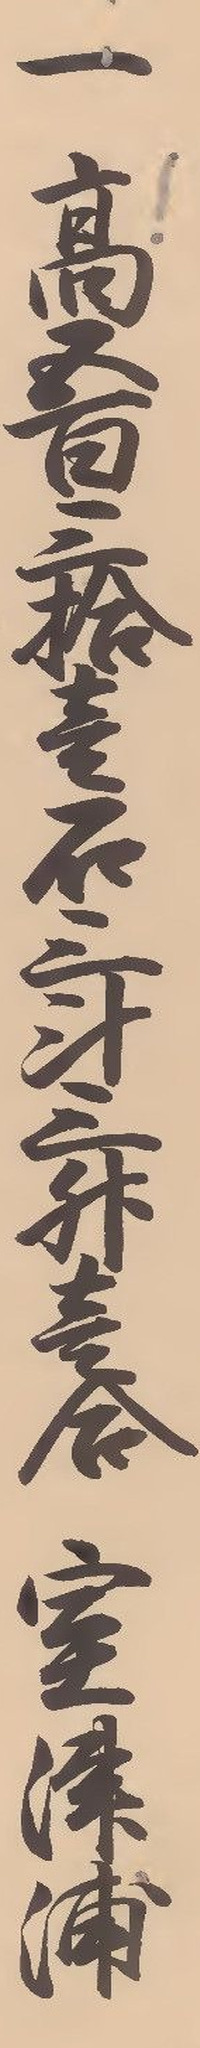一高五百三拾壱石三斗三升壱合室津浦
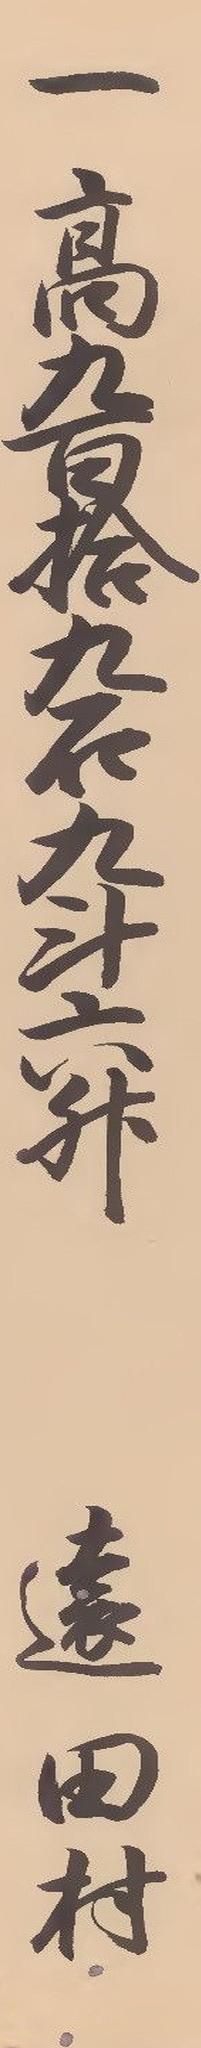一高九百拾九石九斗六升遠田村
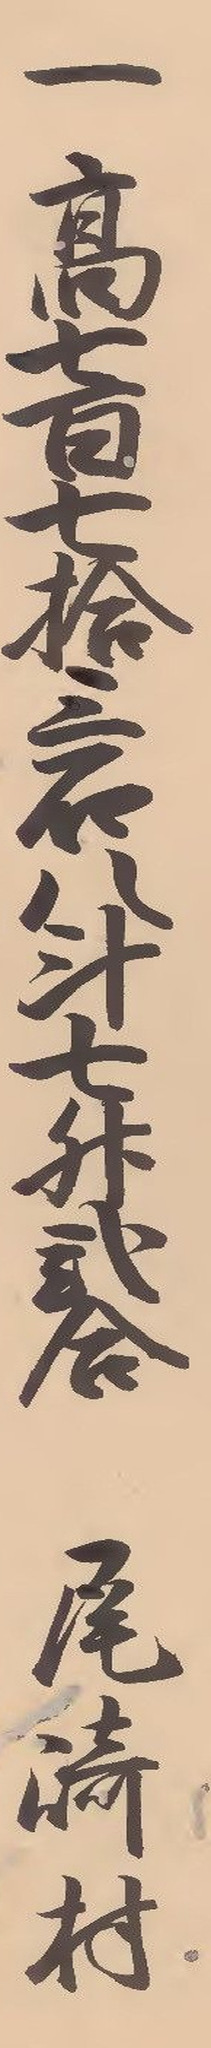一高七百七拾三石八斗七升弐合尾崎村
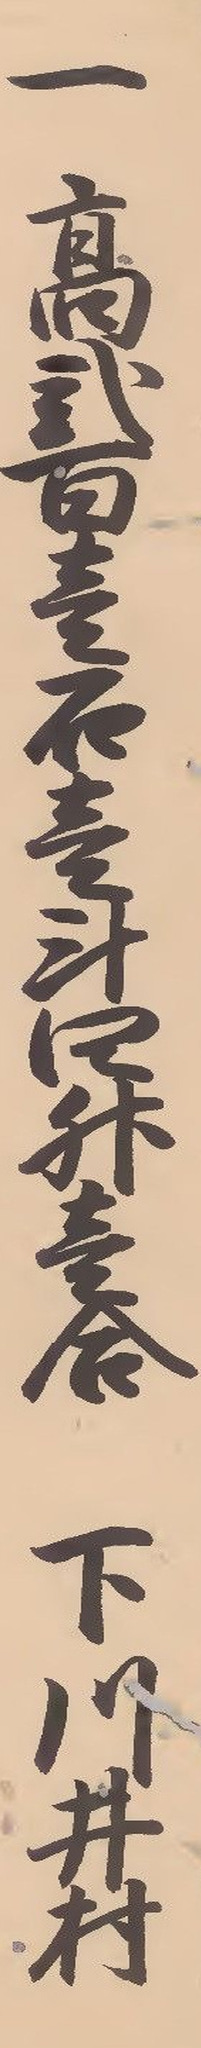一高弐百壱石壱斗四升壱合下川井村
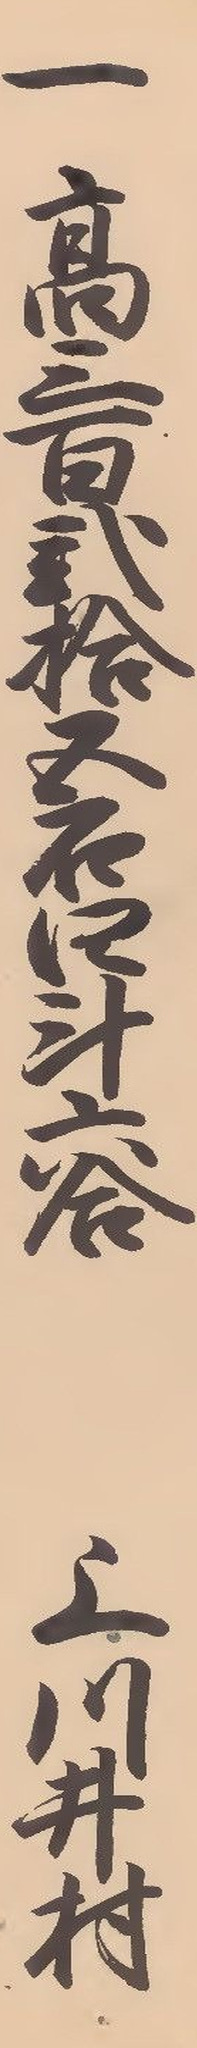一高三百弐拾五石四斗六合上川井村
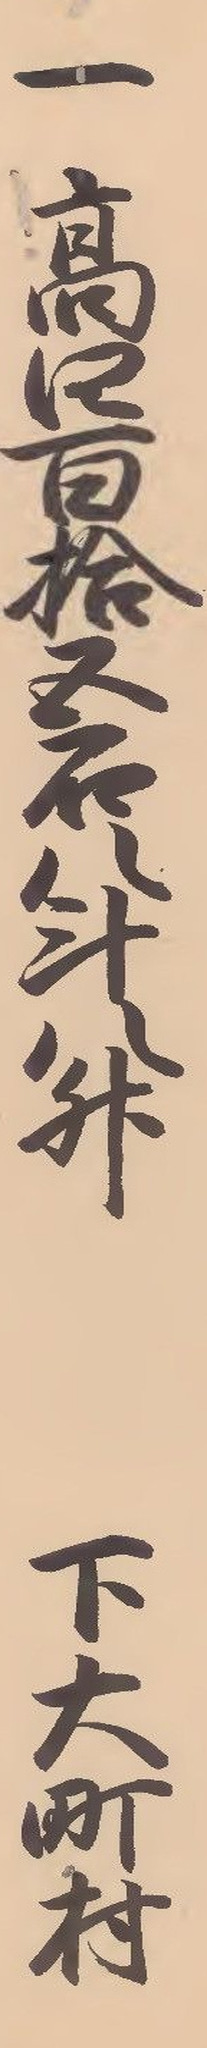一高四百拾五石八斗八升下大町村
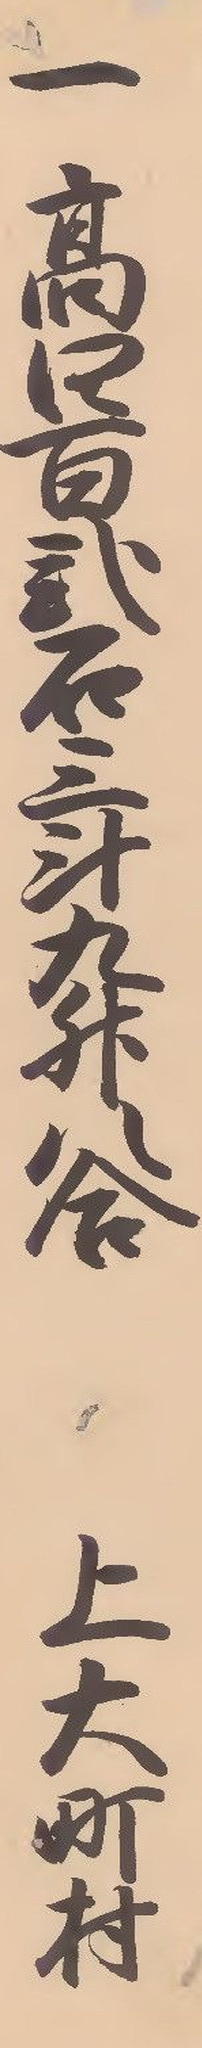一高四百弐石三斗九升八合上大町村

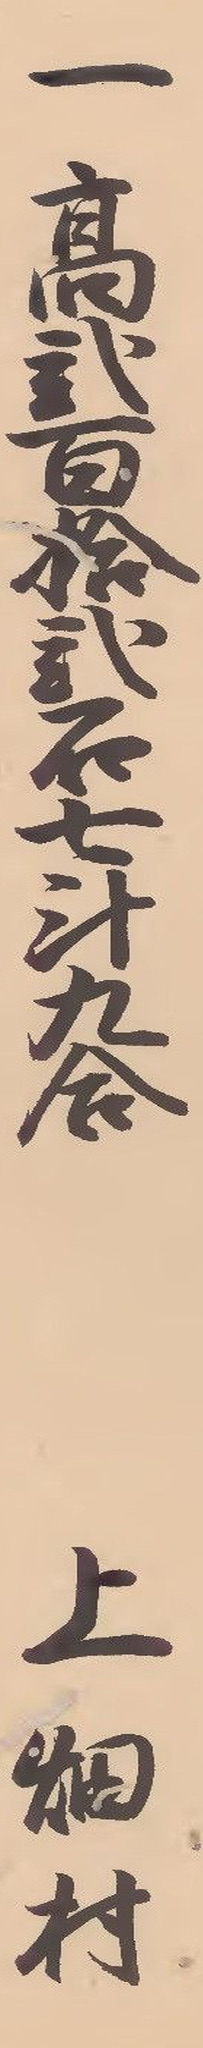一高弐百拾弐石七斗九合上畑村
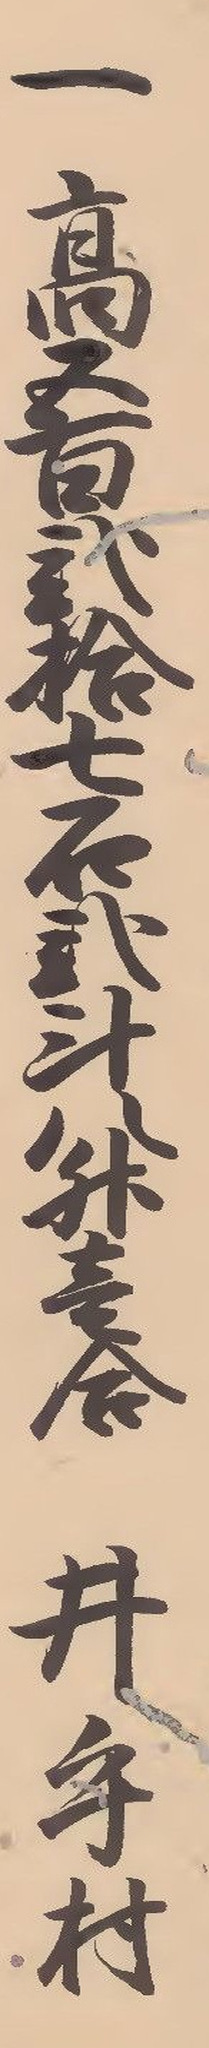一高五百弐拾七石弐斗八升壱合井手村
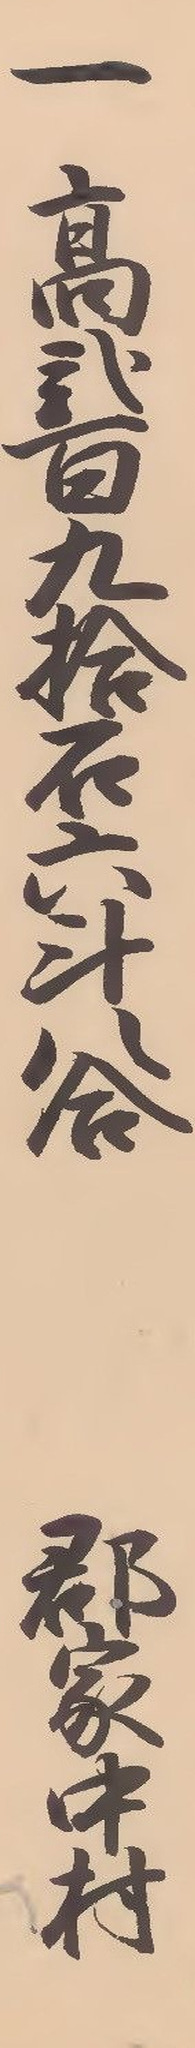一高弐百九拾石六斗八合郡家中村
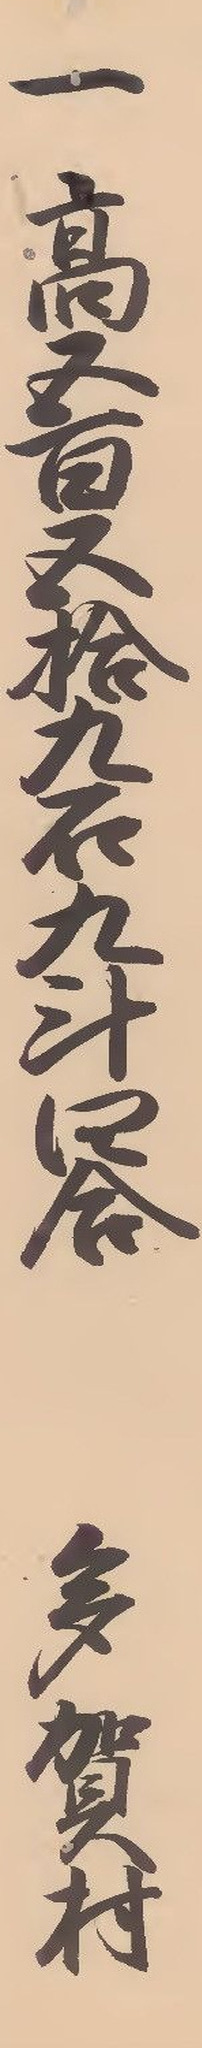一高五百五拾九石九斗四合多賀村
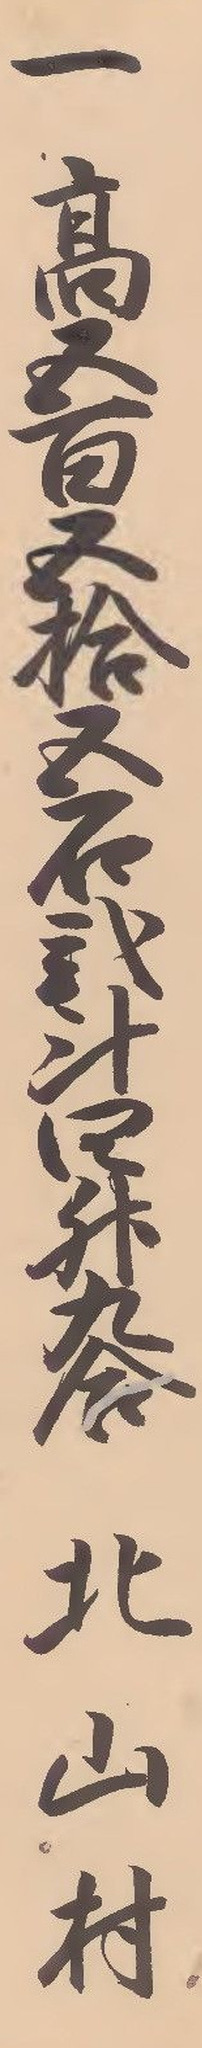一高五百五拾五石弐斗四升九合北山村

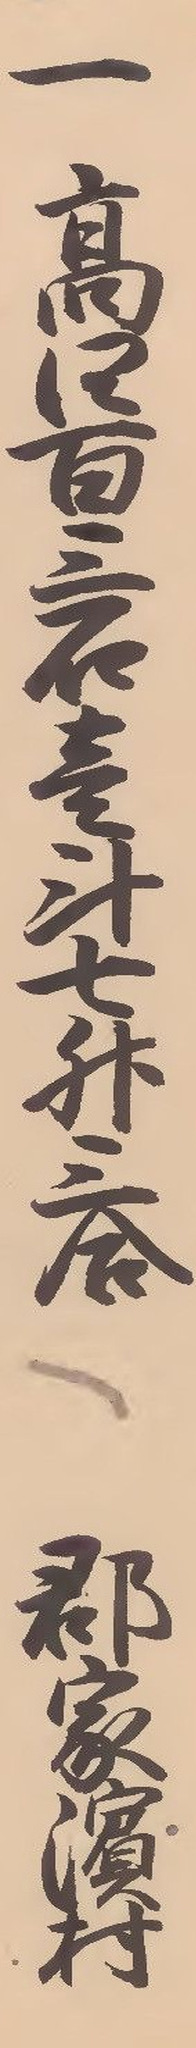一高四百三石壱斗七升三合郡家浜村
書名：淡路国郷帳
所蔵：国立公文書館 National Archives of Japan
